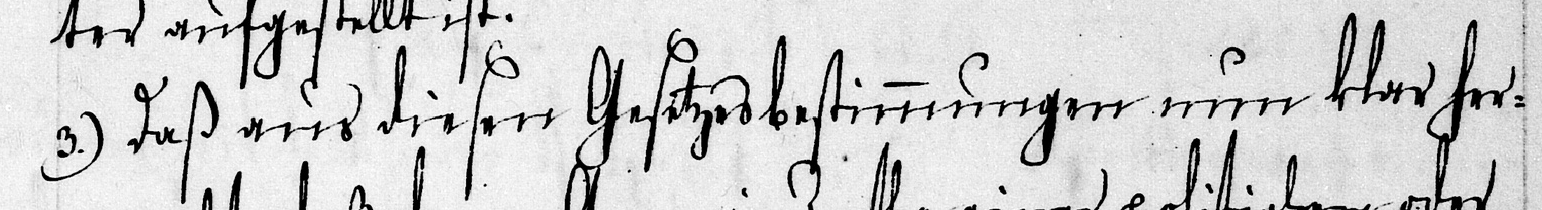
3.) Daß aus diesen Gesetzesbestimmungen nun klar her¬
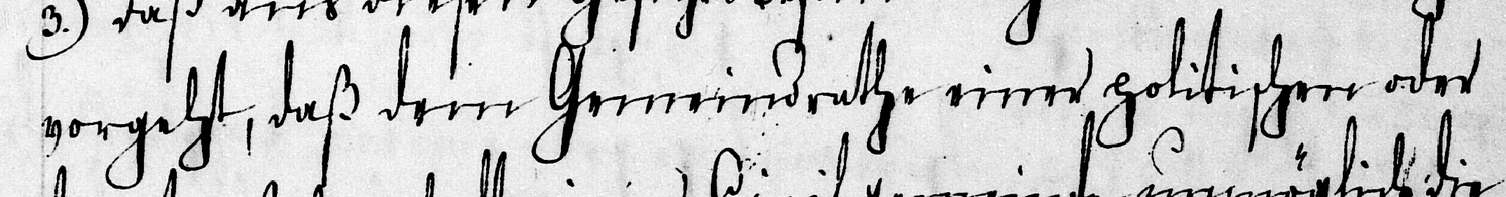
vorgeht, daß dem Gemeindrathe einer politischen oder
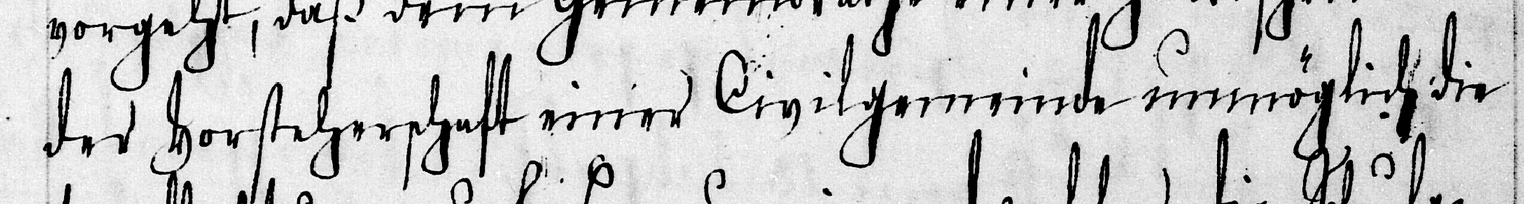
der Vorsteherschaft einer Civilgemeinde unmöglich die
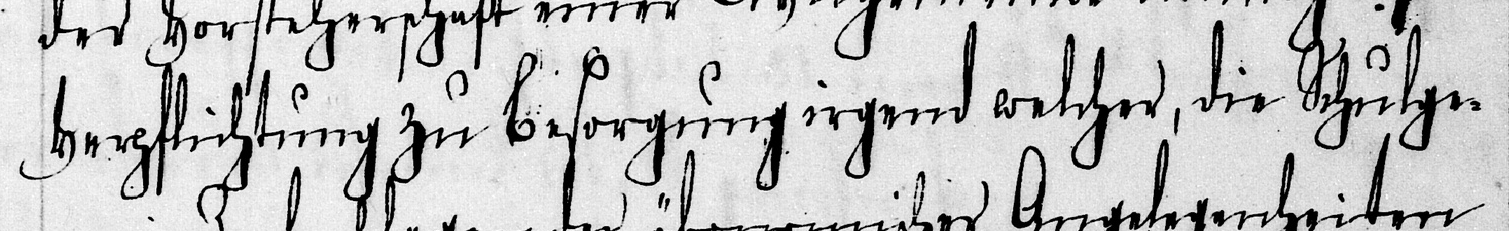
Verpflichtung zu Besorgung irgend welcher, die Schulg¬
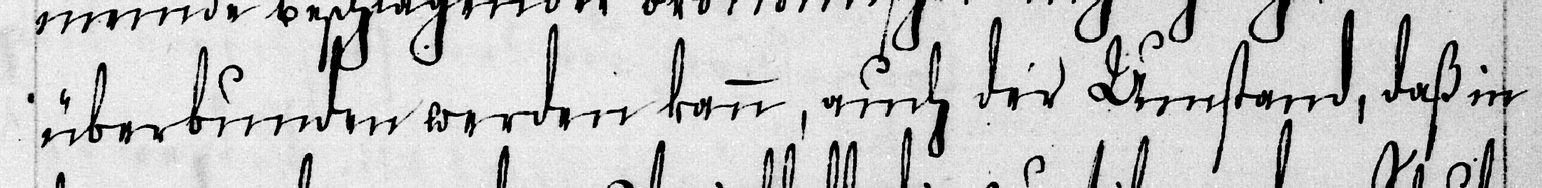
überbunden werden kann, auch der Umstand, daß in
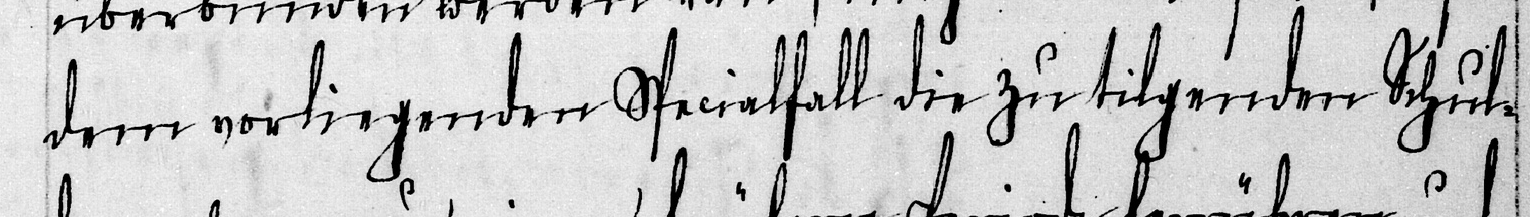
dem vorliegenden Specialfall die zu tilgenden Schul¬
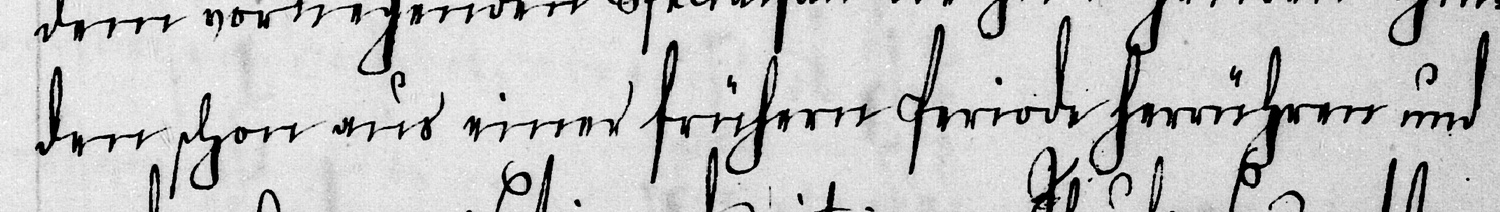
den schon aus einer frühern Periode herrühren und
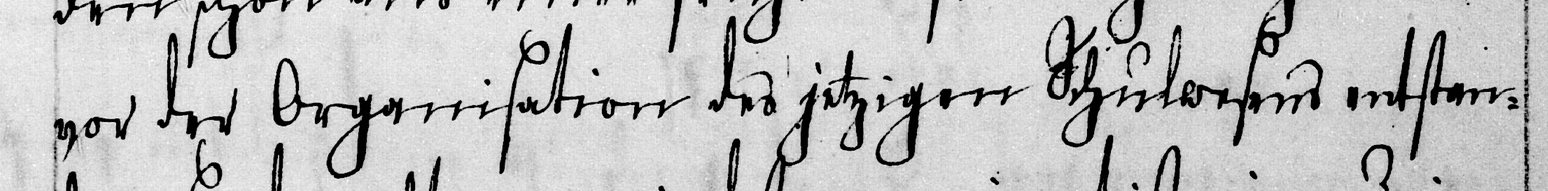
vor der Organisation des jetzigen Schulwesens entstan¬
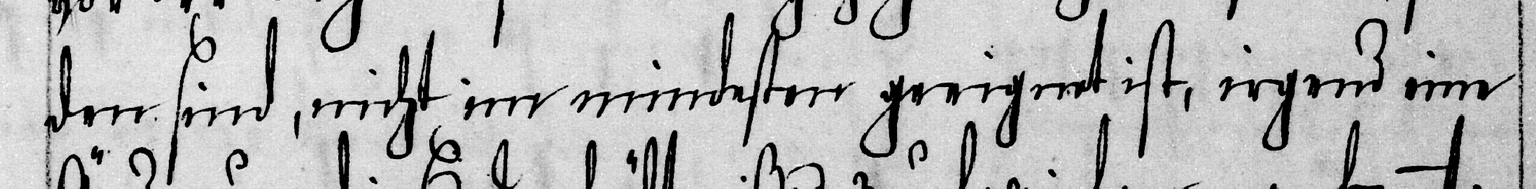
den sind, nicht im mindesten geeignet ist, irgend eine
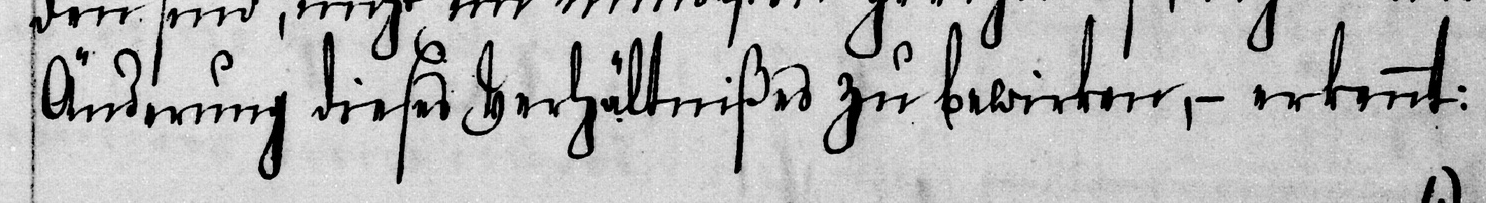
Änderung dieses Verhältnißes zu bewirken, – erkennt:
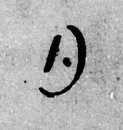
1.
